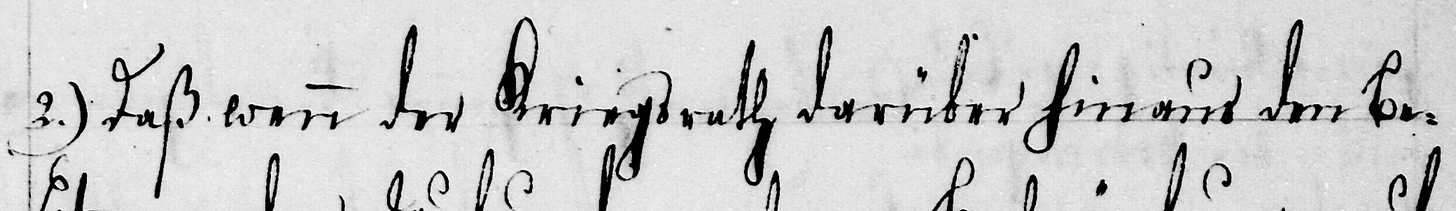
2.) Daß wenn der Kriegsrath darüber hinaus den Be¬
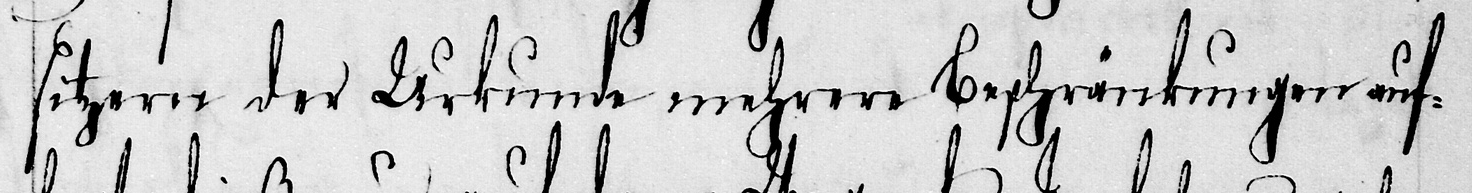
sitzern der Urkunde mehrere Beschränkungen auf¬
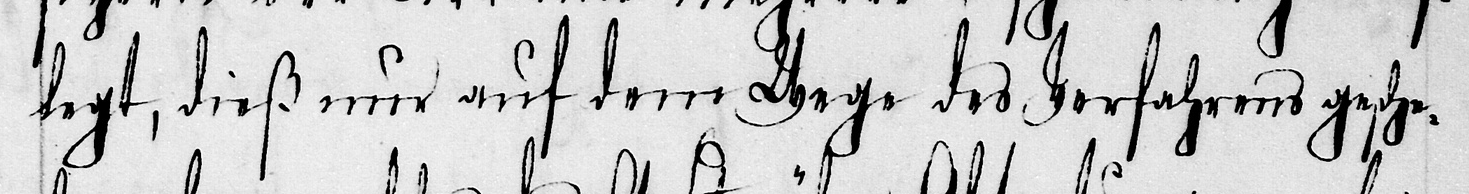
legt, dieß nur auf dem Wege des Verfahrens gesche¬
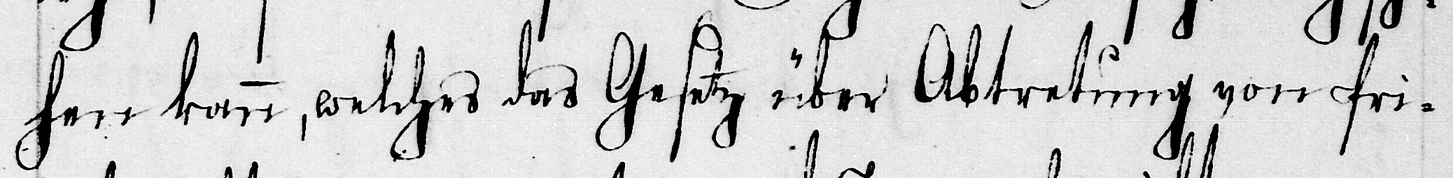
hen kann, welche das Gesetz über Abtretung von Pri¬
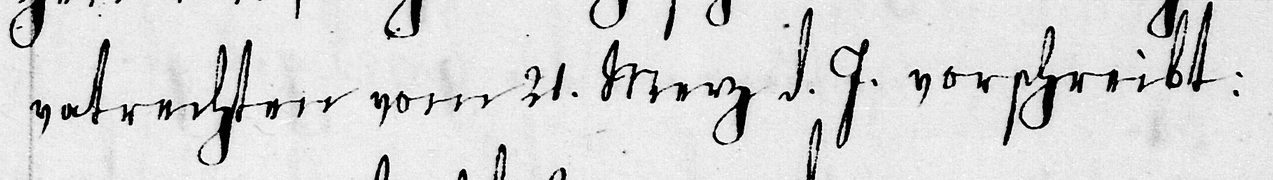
vatrechten vom 21. Merz d. J. vorschreibt:
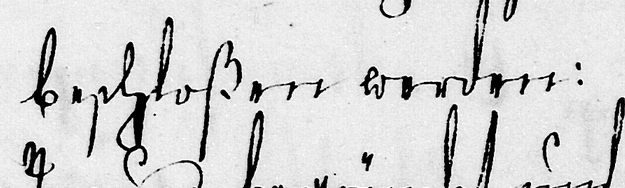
beschloßen werden:
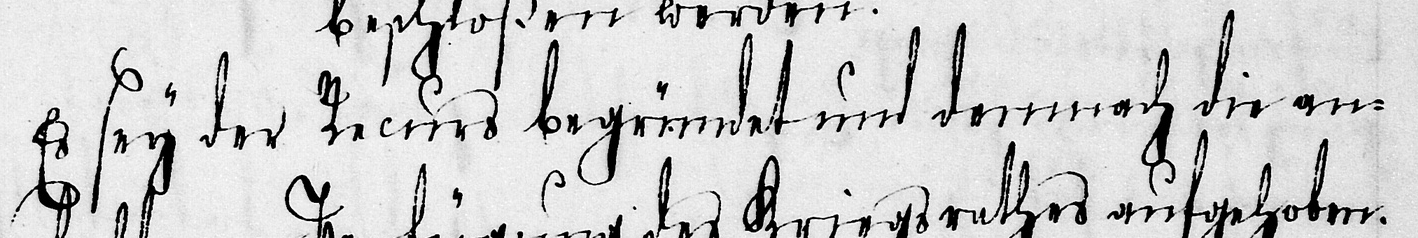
Es sey der Recurs begründet und demnach die an¬
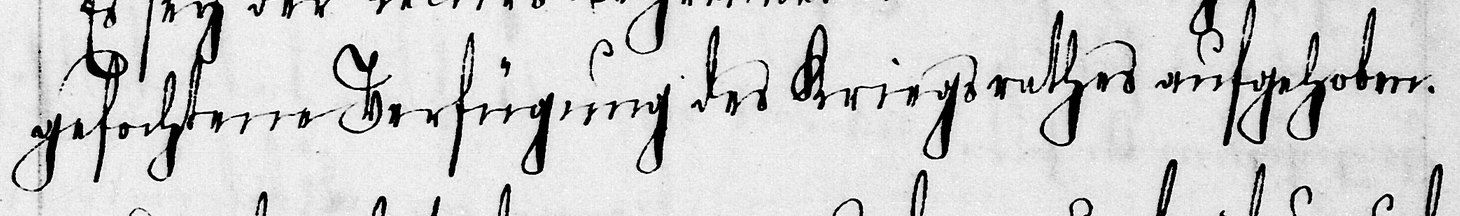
gefochtene Verfügung des Kriegsrathes aufgehoben.
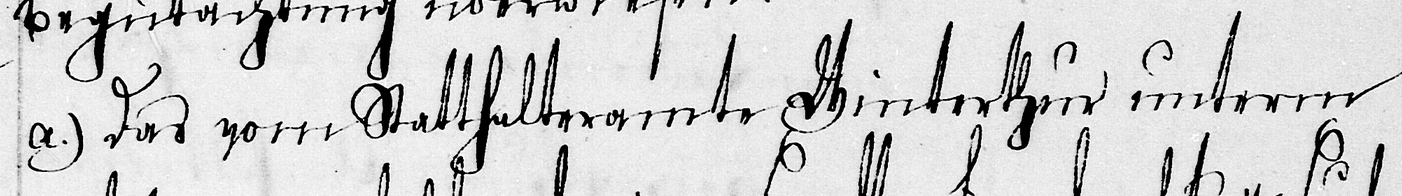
a) Das vom Statthalteramte Winterthur unterm
